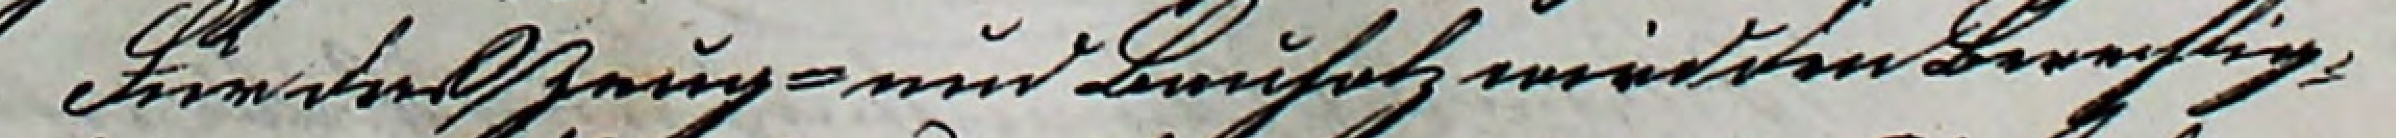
Für das Zeug = und Bauholz wird den Berechtig„
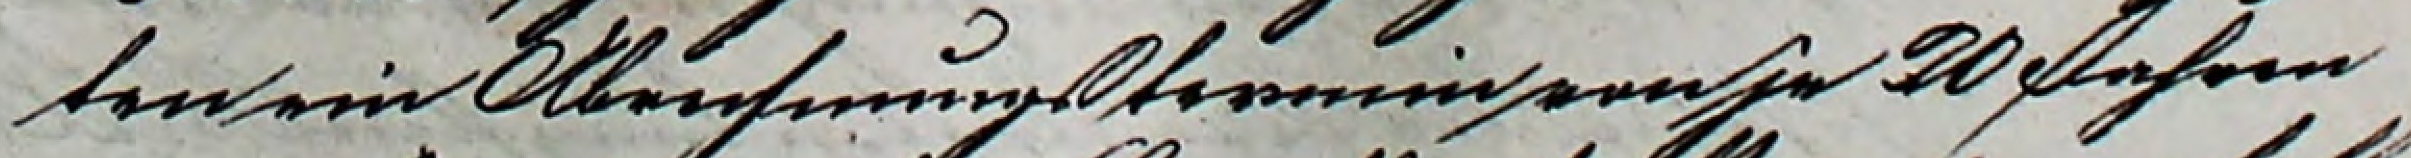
ten ein Abrechnungstermin von je 20 Jahren
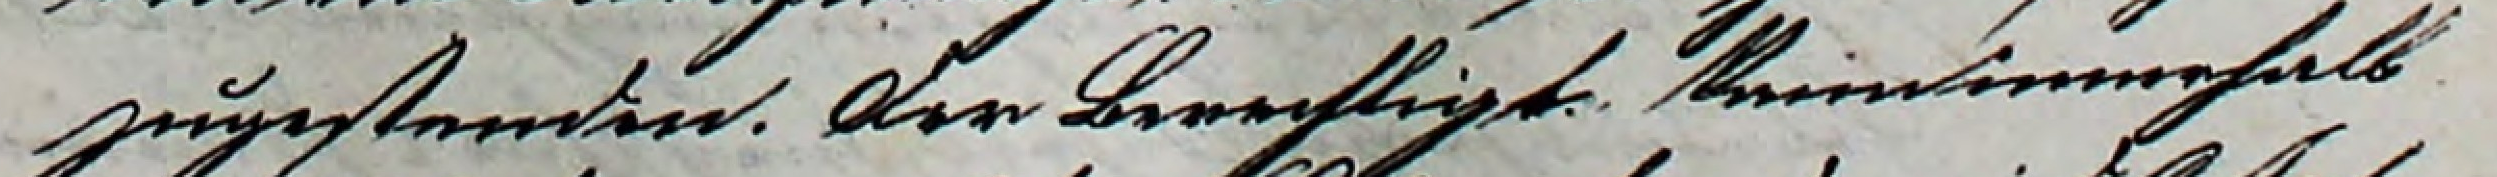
zugestanden. Der Berechtigt kann innerhalb
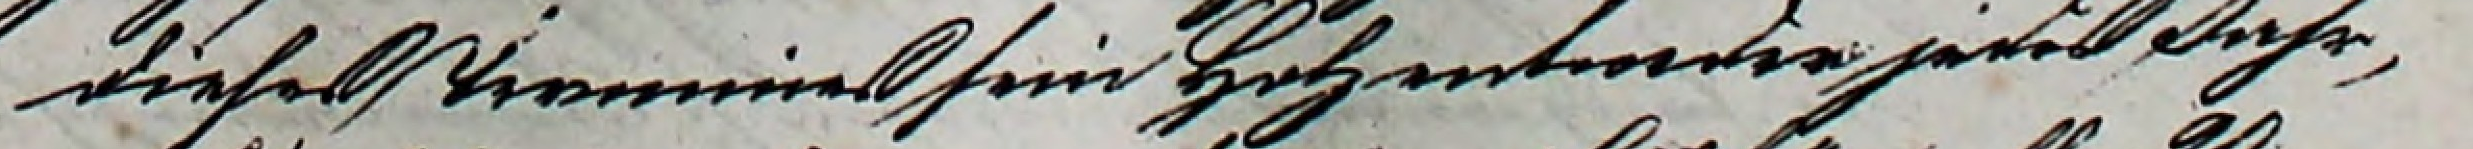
dieses Termines sein Holz entweder jedes Jahr,
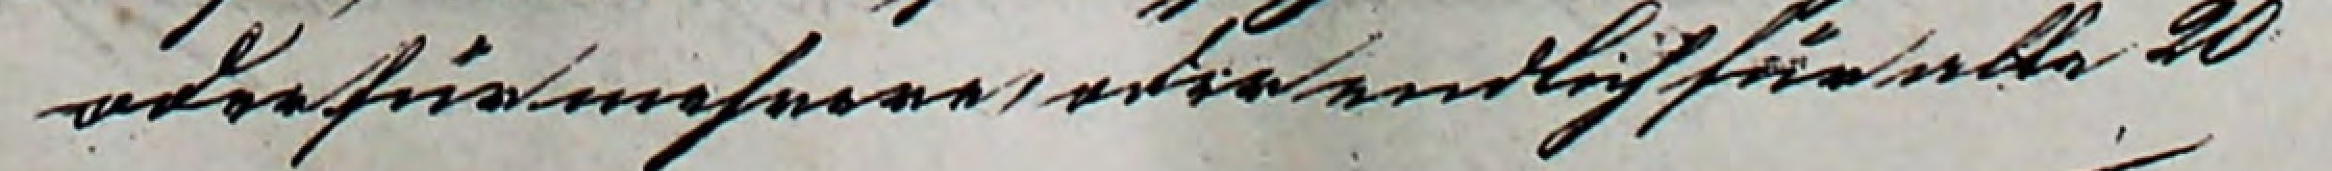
oder für mehrere, oder endlich für alla 20
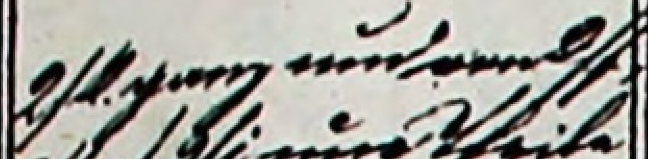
2/k. ganz und am 2/f,
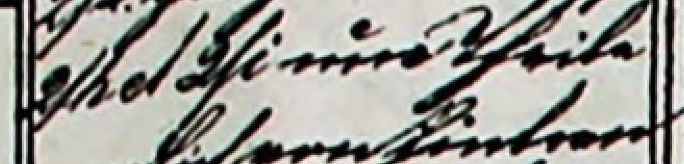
2/h et 2/i und Theile
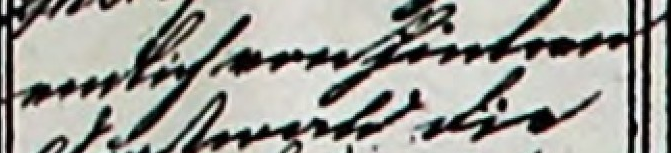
emlichren Hintern
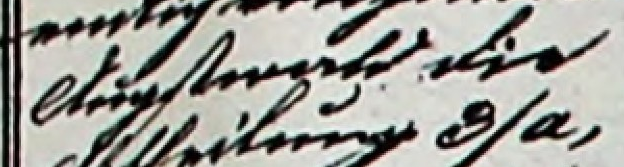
Augstwald die
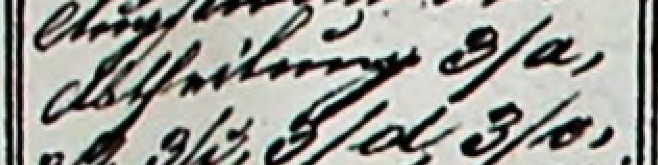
Abtheilung 3/a,
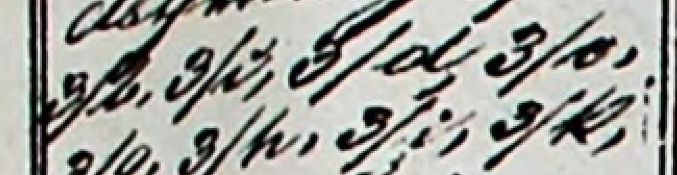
3/b, 3/c, 3/d, 3/e,
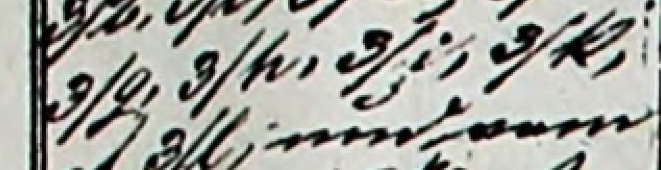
3/g, 3/h, 3/i, 3/k,
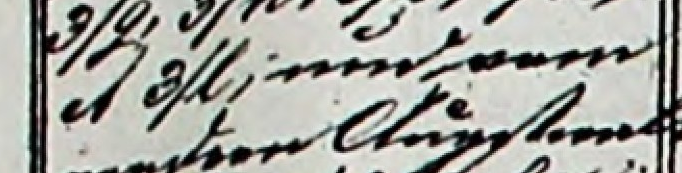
et 3/l, und vom
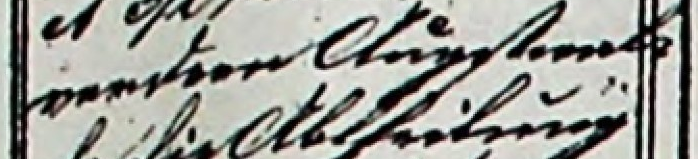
verdern Augstwal„
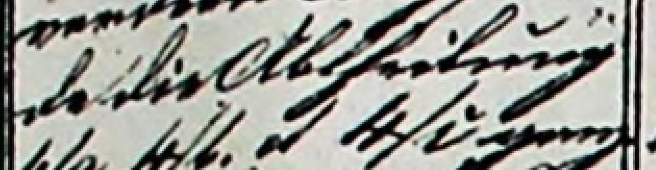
de die Abtheilung
